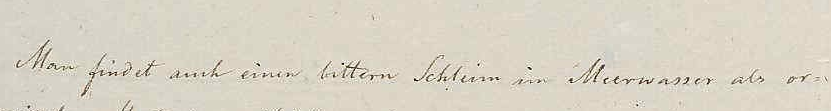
Man findet auch einen bittern Schleim im Meerwasser als or-
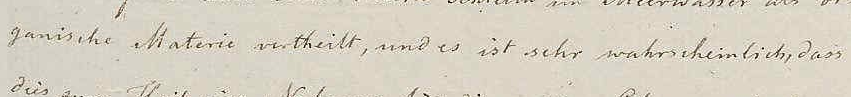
ganische Materie vertheilt, und es ist sehr wahrscheinlich, dass
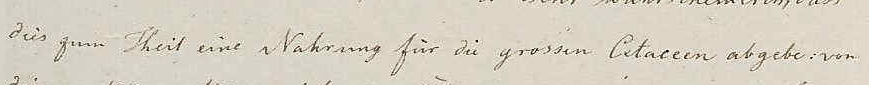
dies zum Theil eine Nahrung für die grossen Cetaceen abgebe: von
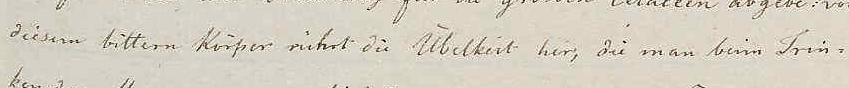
diesem bittern Körper rührt die Übelkeit her, die man beim Trin-
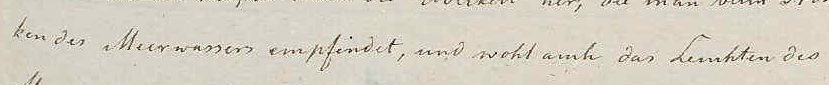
ken des Meereswassers empfindet, und wohl auch das Leuchten des
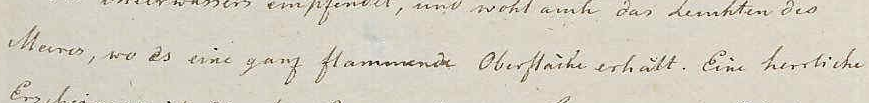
Meeres, wo des eine ganz flammende Oberfläche erhält. Eine herrliche
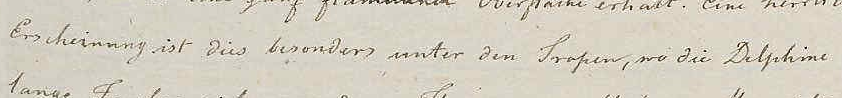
Erscheinung ist dies besonders unter den Tropen, wo die Delphine
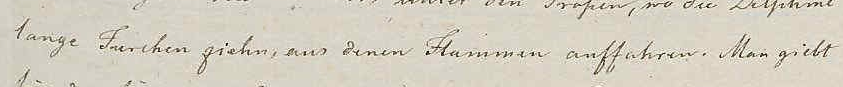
lange Furchen ziehn, aus denen Flammen auffahren. Man giebt
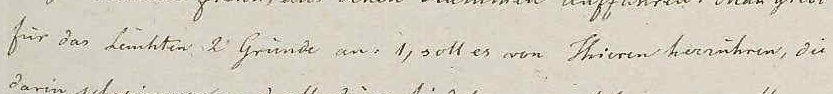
für das Leuchten 2 Gründe an: 1, soll es von Thieren herrühren, die
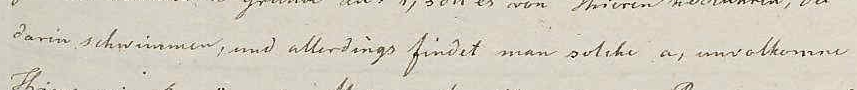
darin schwimmen, und allerdings findet man solche a, unvolkomne
